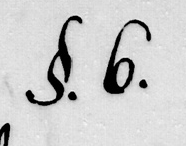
§. 6.
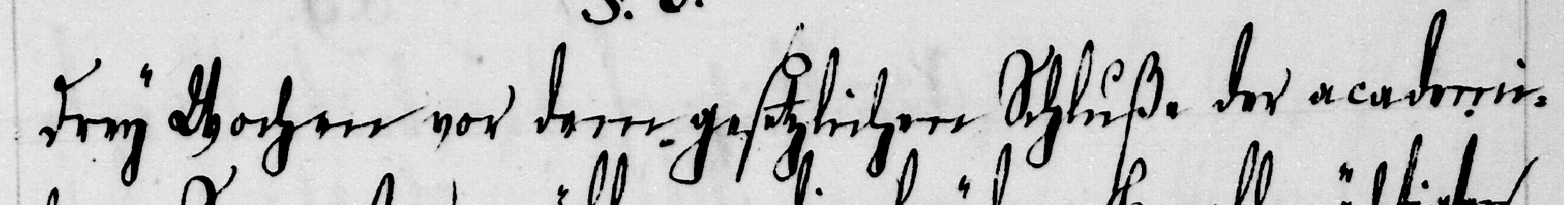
Drey Wochen vor dem gesetzlichen Schluße der academi¬
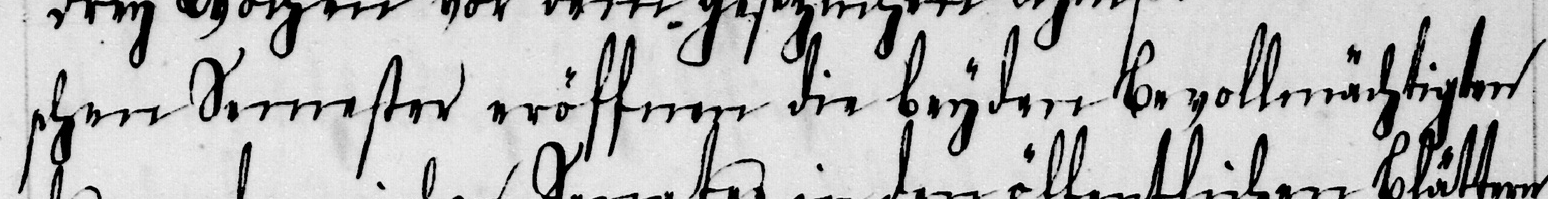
schen Semester eröffnen die beyden Bevollmächtigten
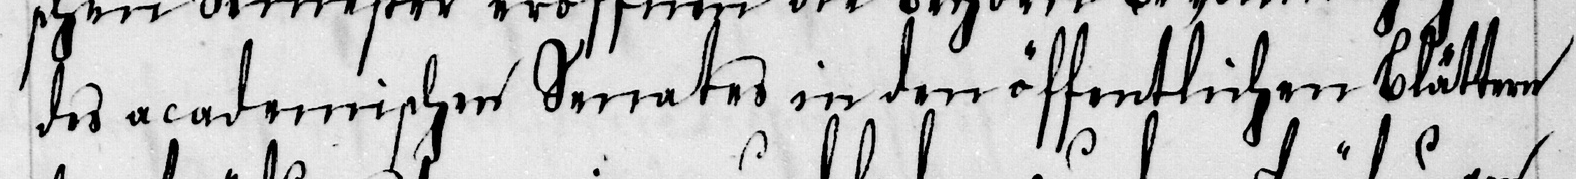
des academischen Senates in den öffentlichen Blättern
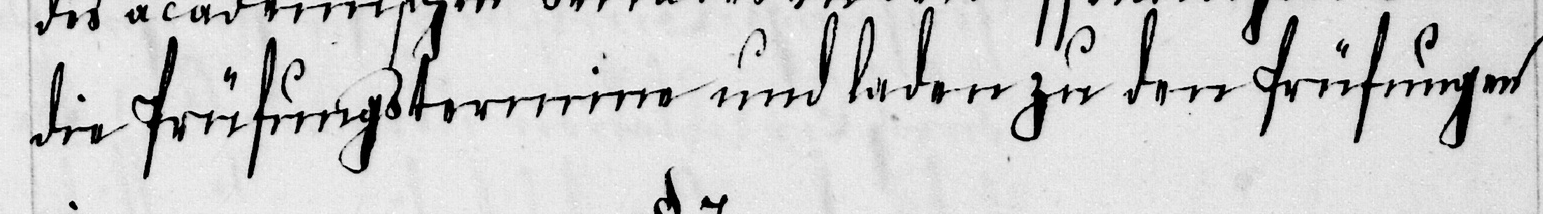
die Prüfungstermine und laden zu den Prüfungen
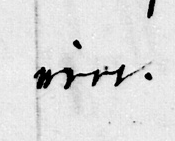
ein.
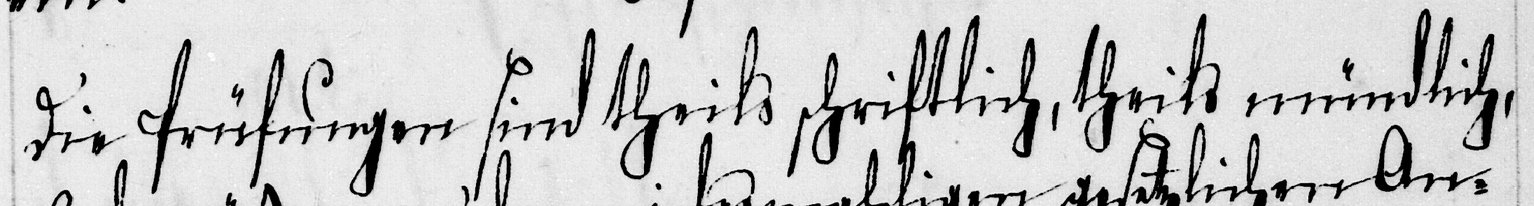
Die Prüfungen sind theils schriftlich, theils mündlich,
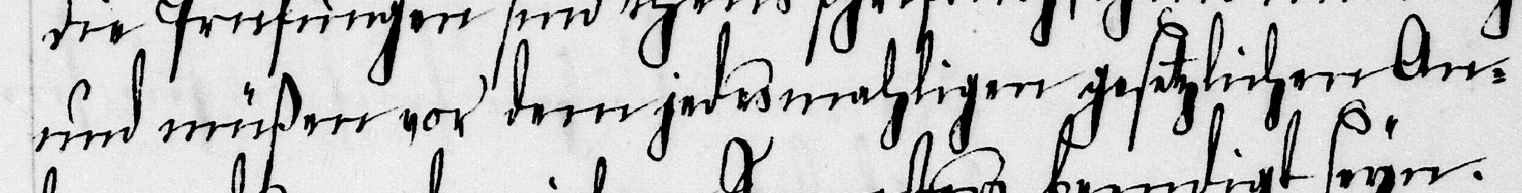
und müßen vor dem jedesmahligen gesetzlichen An¬
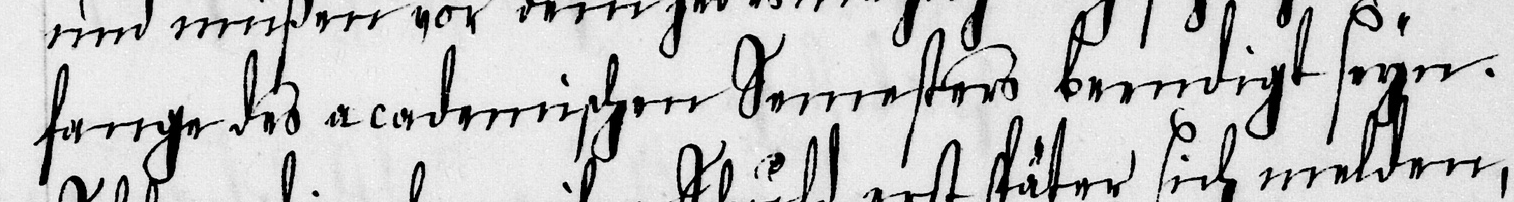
fange des academischen Semesters beendigt seyn.
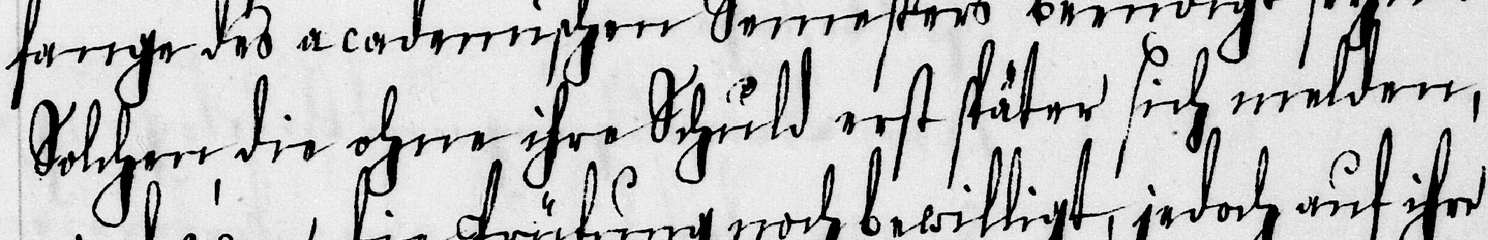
Solchen, die ohne ihre Schuld erst später sich melden,
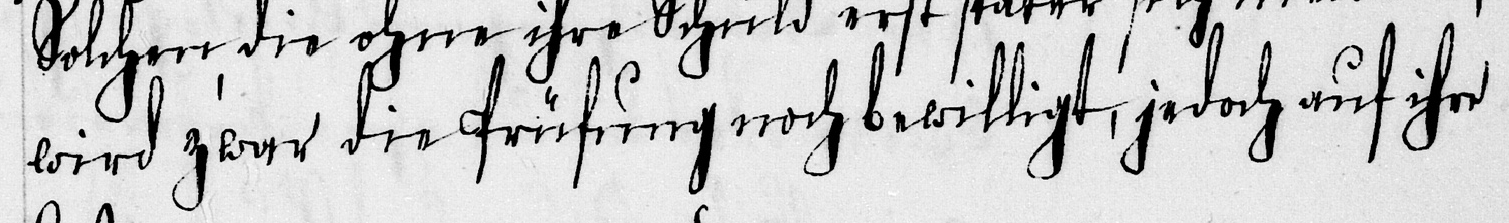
wird zwar die Prüfung noch bewilligt, jedoch auf ihre
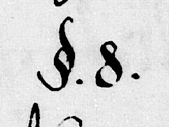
§. 8.
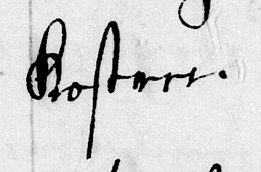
Kosten.
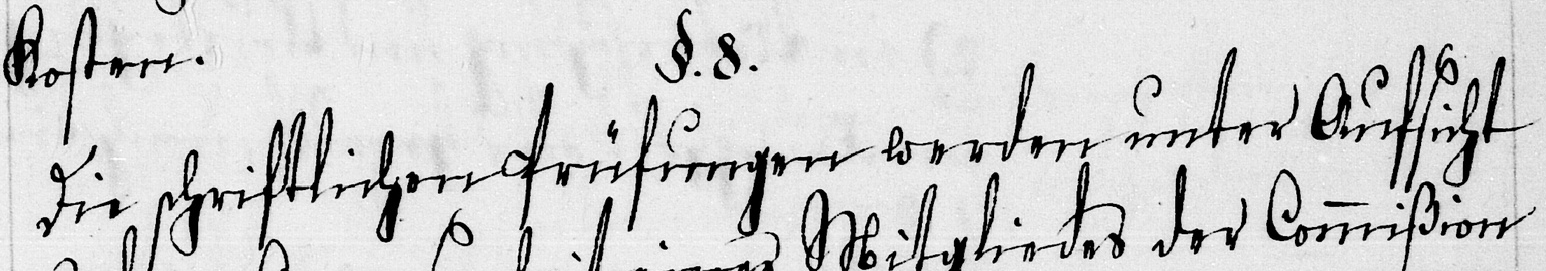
Die schriftlichen Prüfungen werden unter Aufsicht
